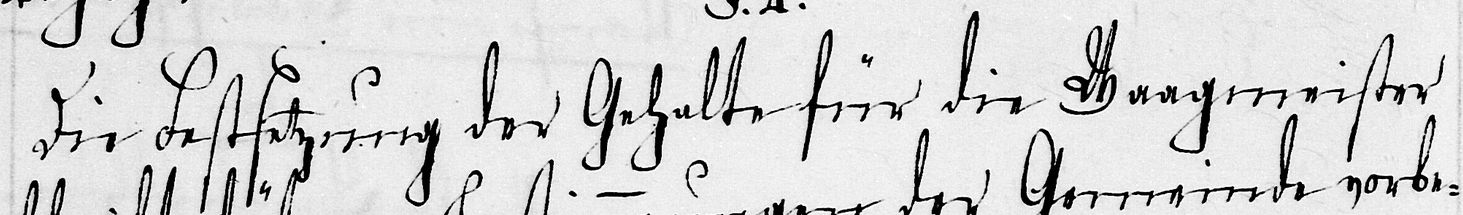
Die Festsetzung der Gehalte für die Waagmeister
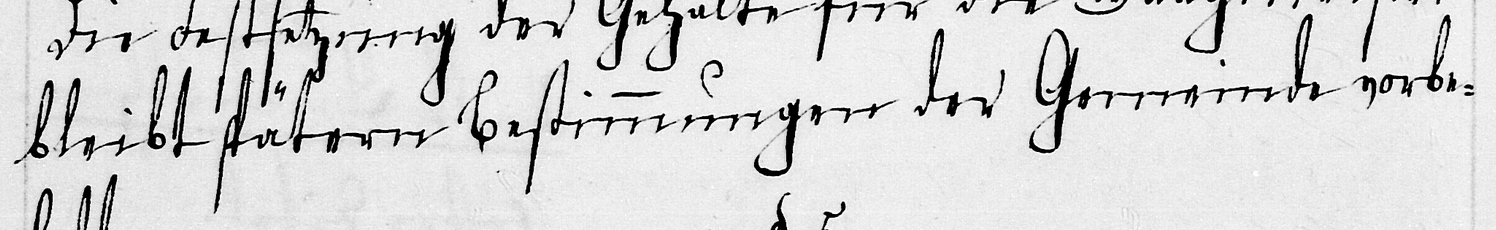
bleibt spätern Bestimmungen der Gemeinde vorbe¬
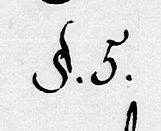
§. 5.
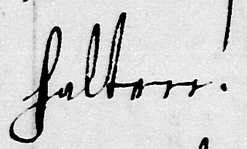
halten.
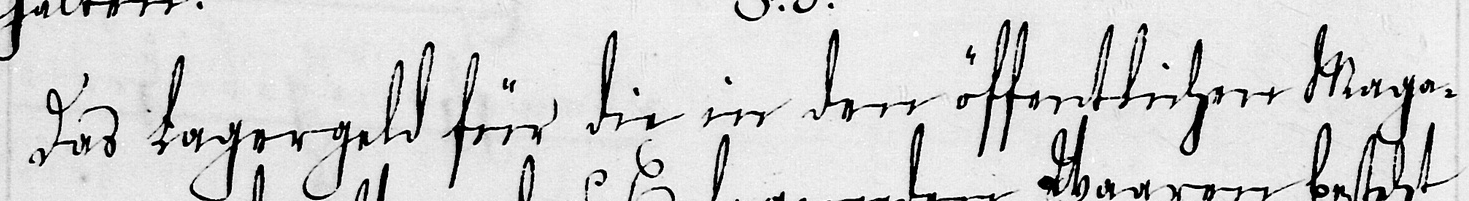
Das Lagergeld für die in den öffentlichen Maga¬
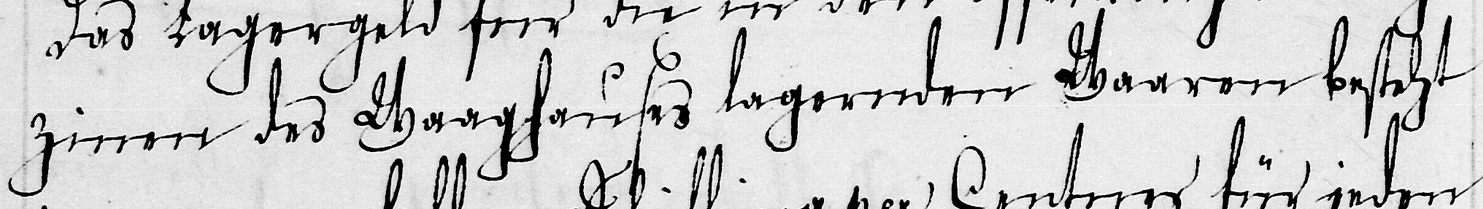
zinen des Waaghauses lagernden Waaren besteht
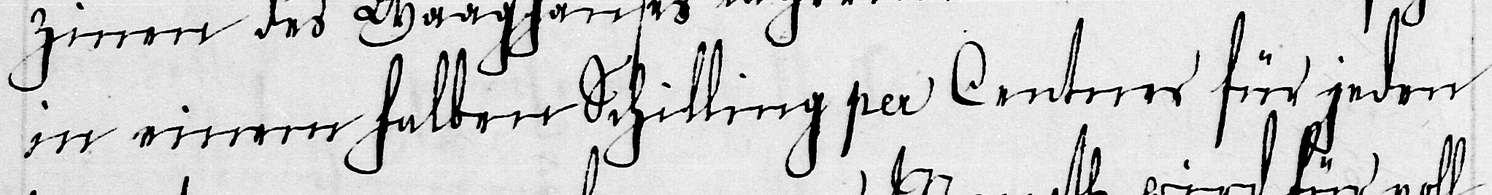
in einem halben Schilling per Centner für jeden
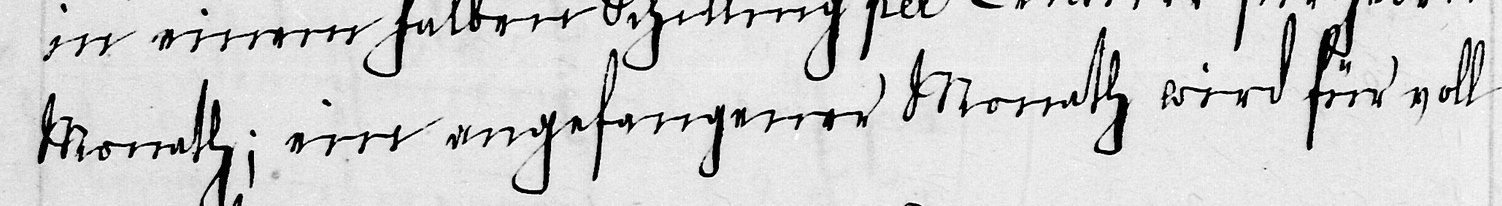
Monath; ein angefangener Monath wird für voll
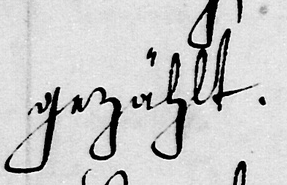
gezählt.
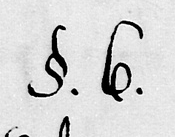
§. 6.
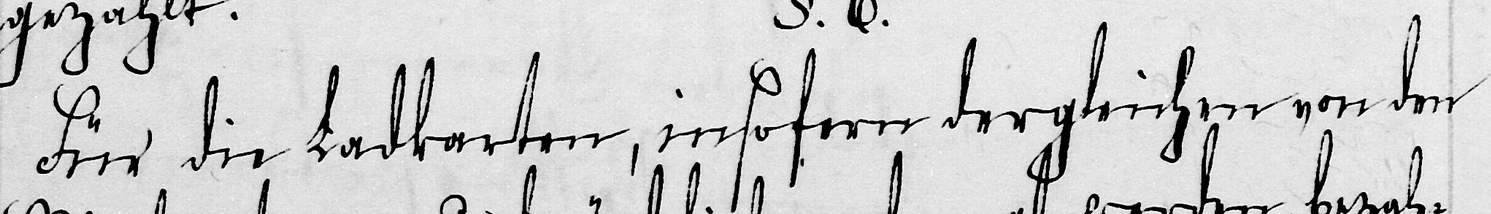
Für die Ladkarten, insofern dergleichen von den
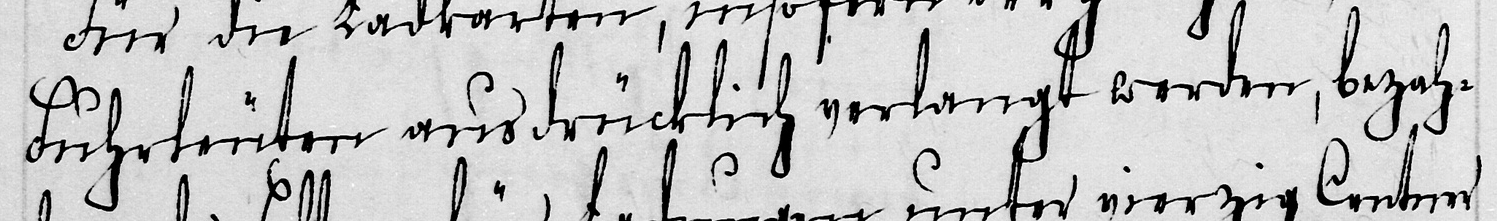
Fuhrleuten ausdrücklich verlangt werden, bezah¬
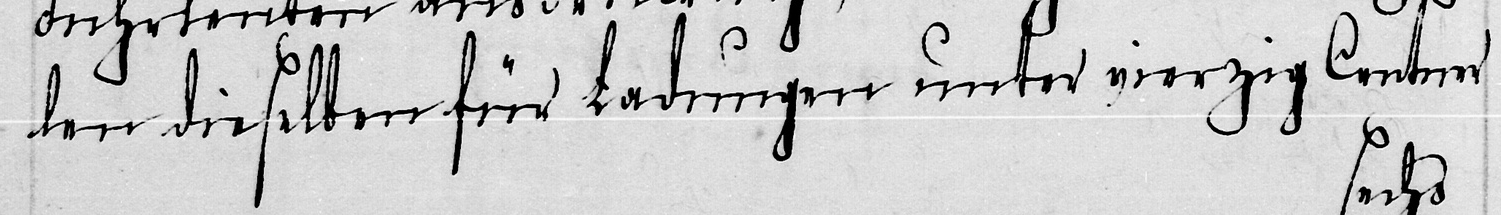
len dieselben für Ladungen unter vierzig Centner
